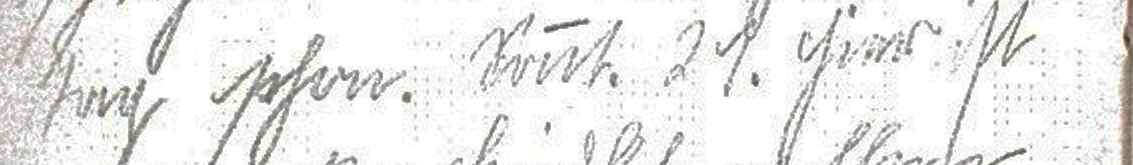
Tag schön. Sont. 21. hier ist
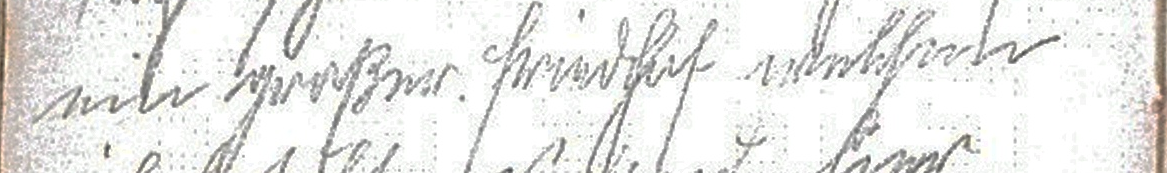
ein großer Friedhof welchen
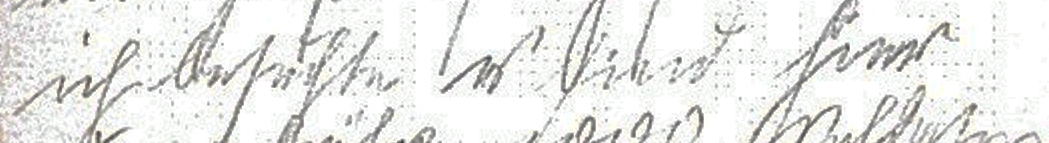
ich besuchte es sind hier
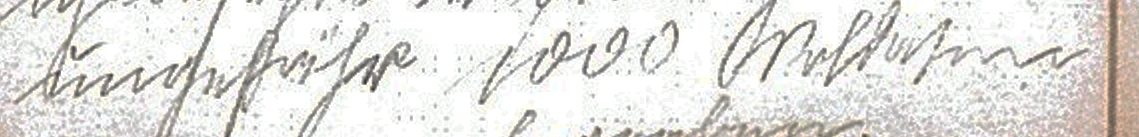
ungefähr 1000 Soldaten
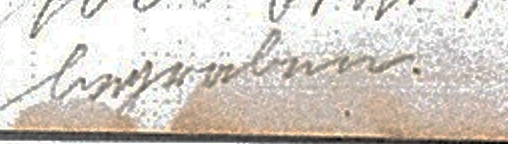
begraben.
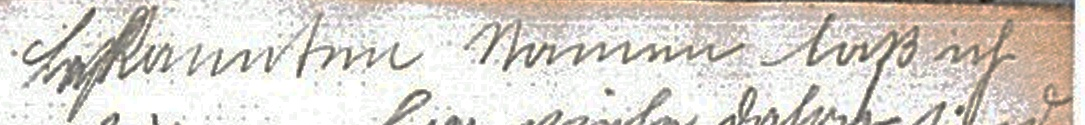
bekannte Namen laß ich
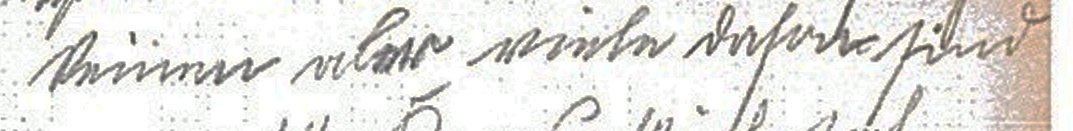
keinen aber viele davon sind
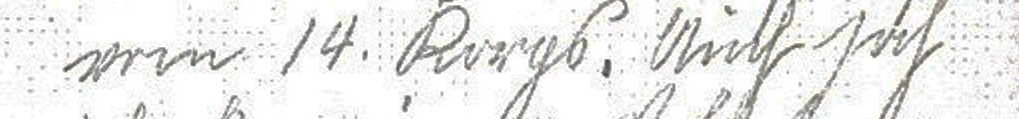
vom 14. Korp. Auch sah
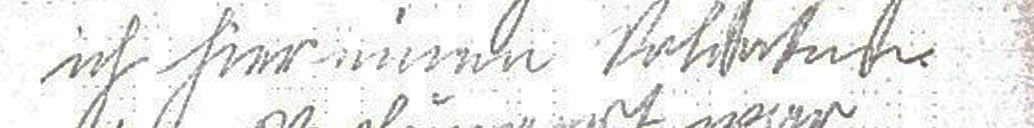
ich hier einen Soldaten
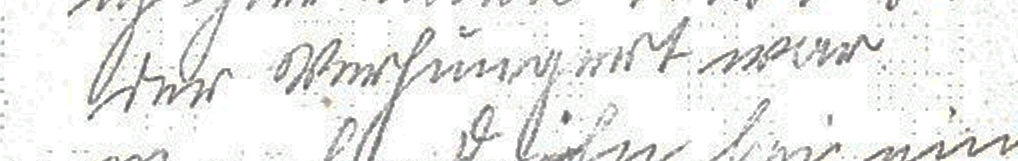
der verhungert war
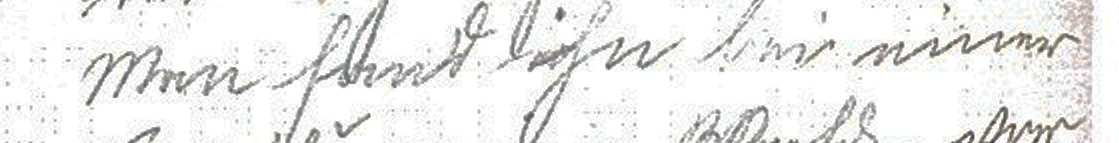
Man fand ihn bei einer
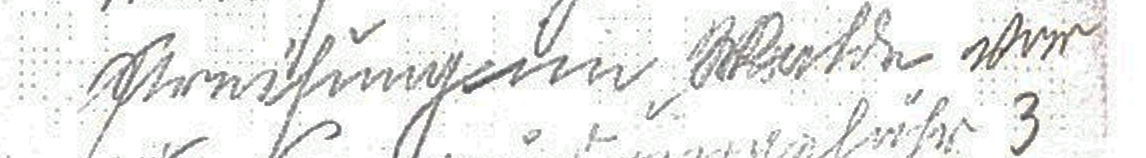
Streifung im Wasser vor
